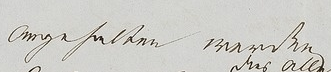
angehalten werden
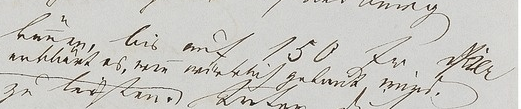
können, bis auf 150 Fr. per
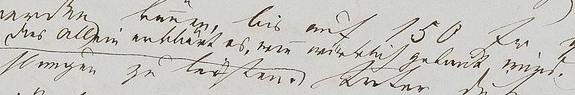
Das allein erklärt es, wenn wirklich gebaut wird.
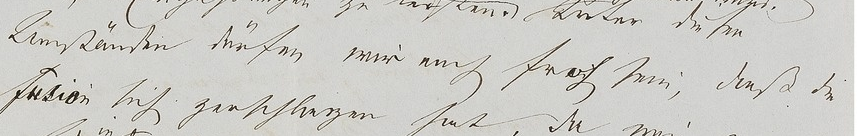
Umständen dürfen wir noch froh sein, daß die
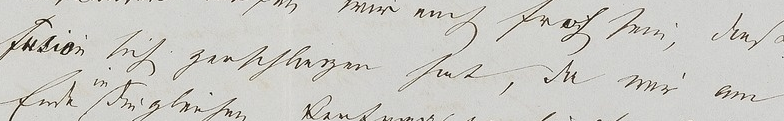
Fusion sich zerschlagen hat, da wir am
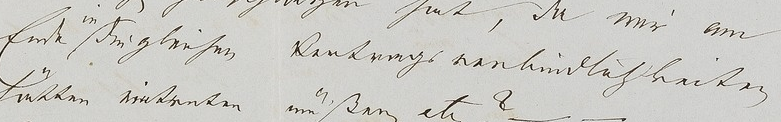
Ende in die gleichen Vertragsverbindlichkeiten
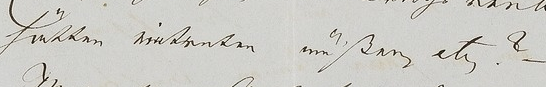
hätten eintreten müßen etc? – –
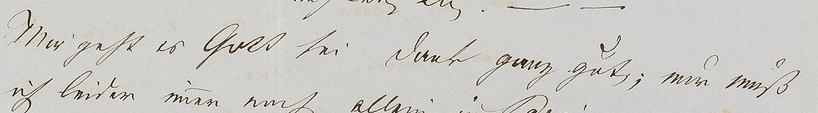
Mir geht es Gott sei Dank ganz gut; nur muß
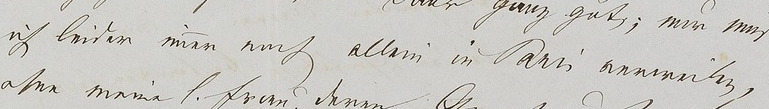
ich leider immer noch allein in Paris verweilen,
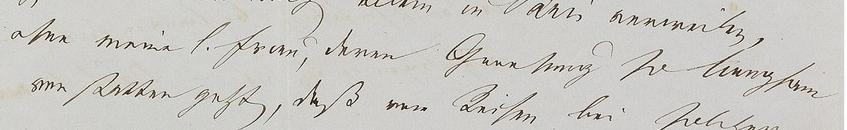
ohne meine l. Frau, deren Genesung so langsam
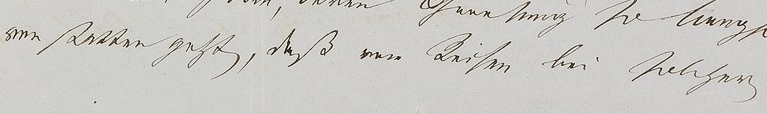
von statten geht, daß von Reisen bei solcher
